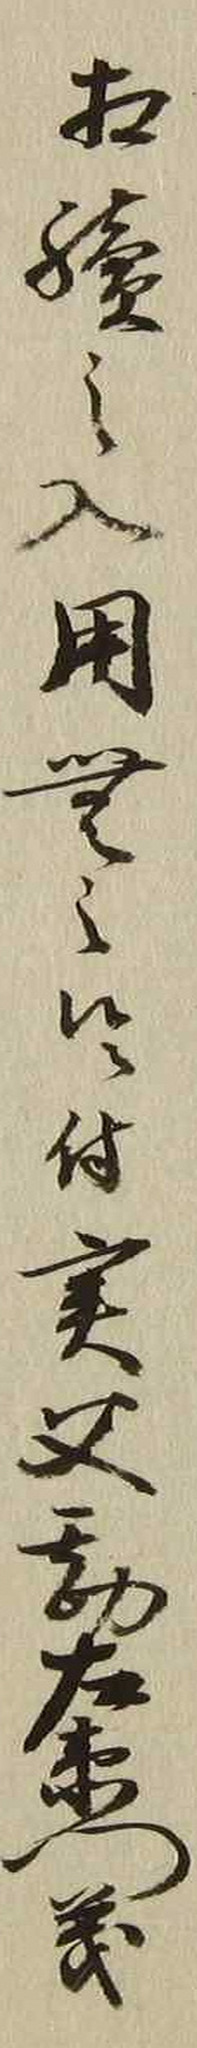相続之入用無之候ニ付実父勘左衛門義
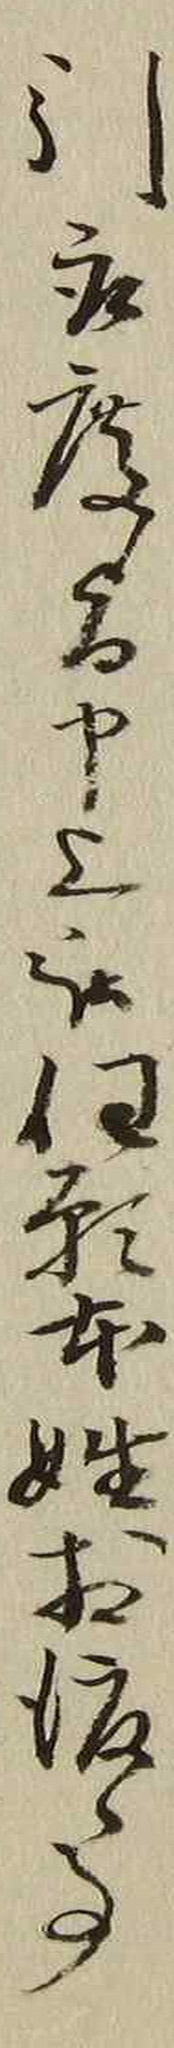引取度旨申上被任願本姓へ相渡候事
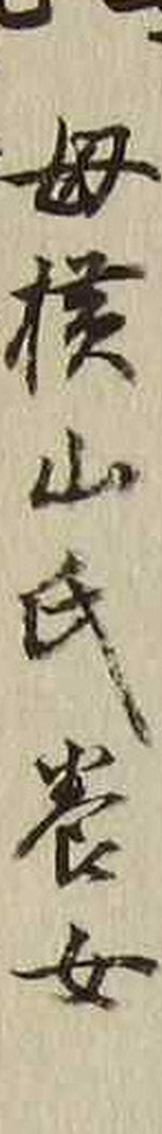母横山氏養女
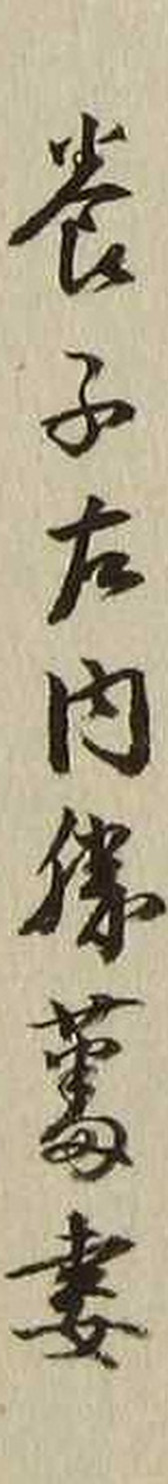女養子左内勝蕃妻
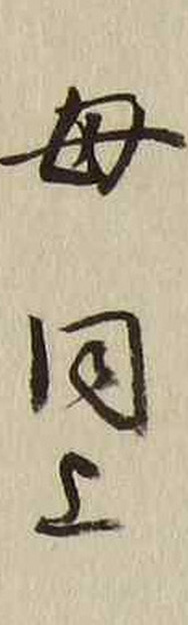母同上

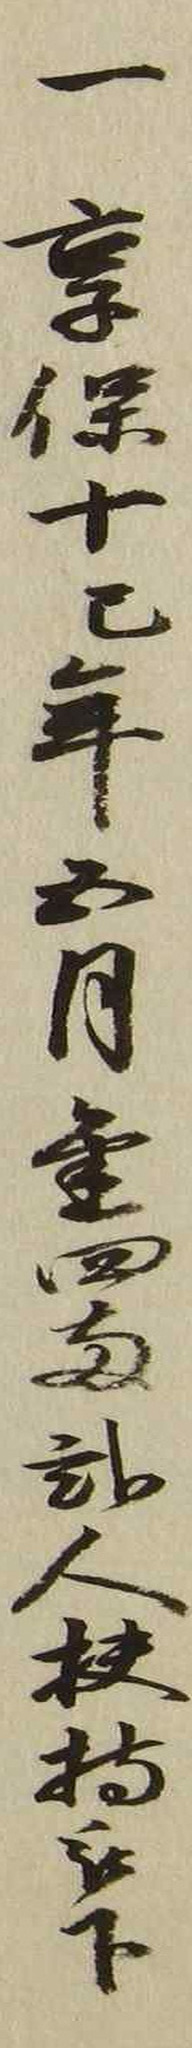一享保十巳年五月金四両弐人扶持被下
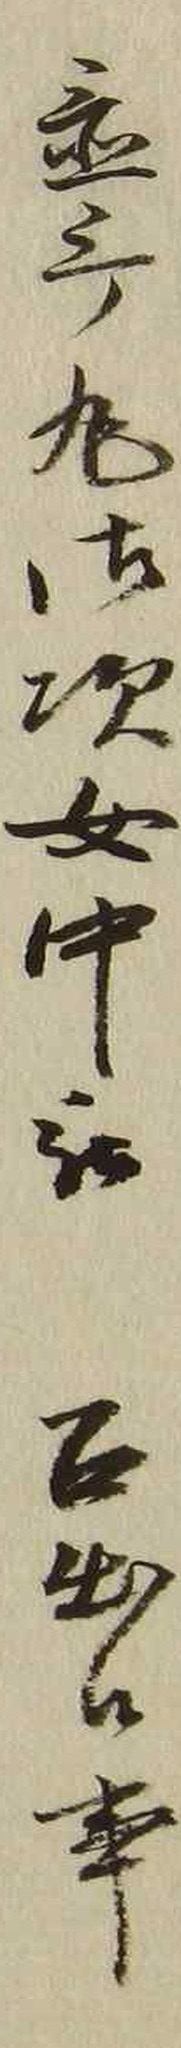置三ノ丸御次女中被召出候事
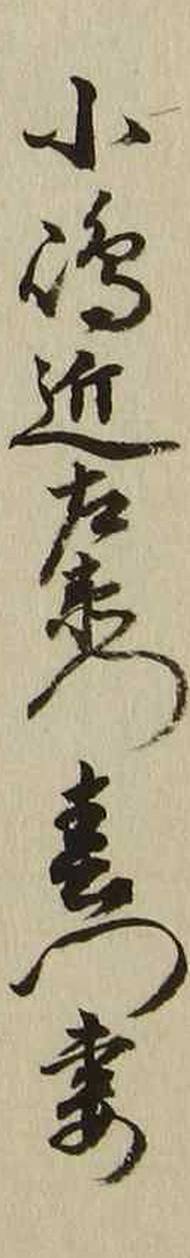女小嶋近左衛門春門妻
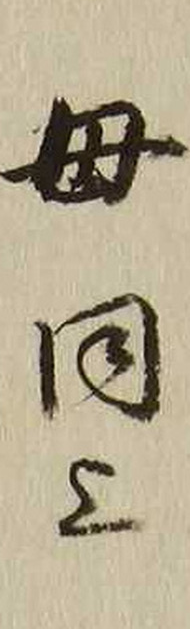母同上
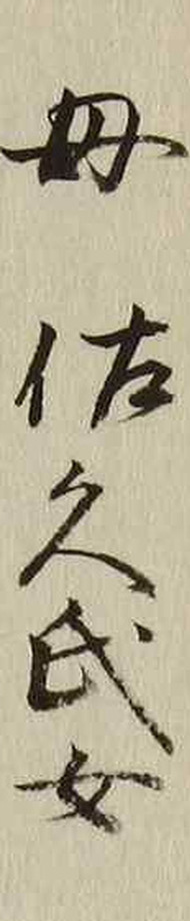母佐久氏女
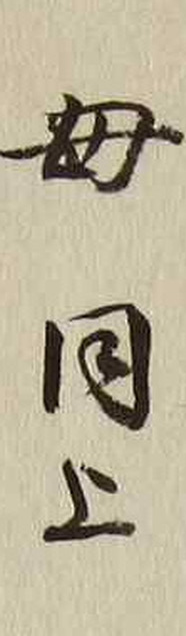母同上
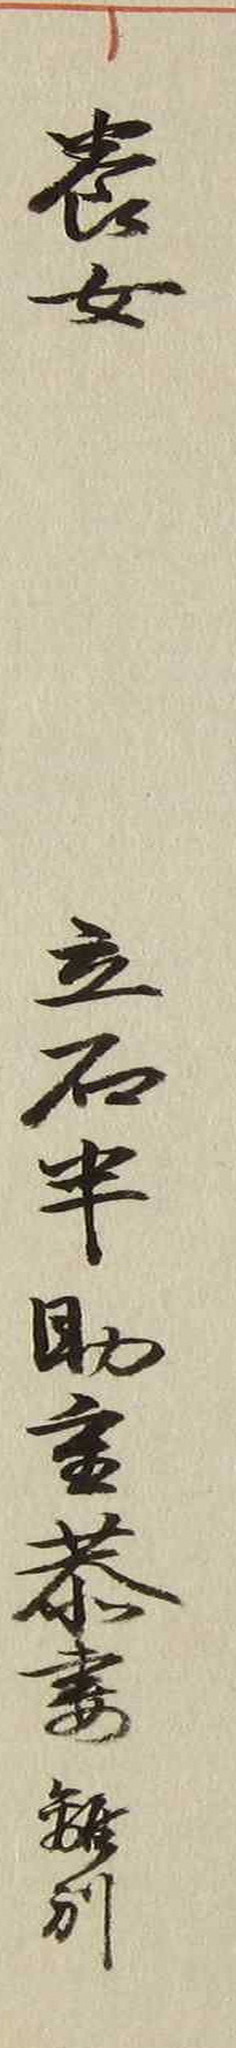養女立石半助重恭妻離別
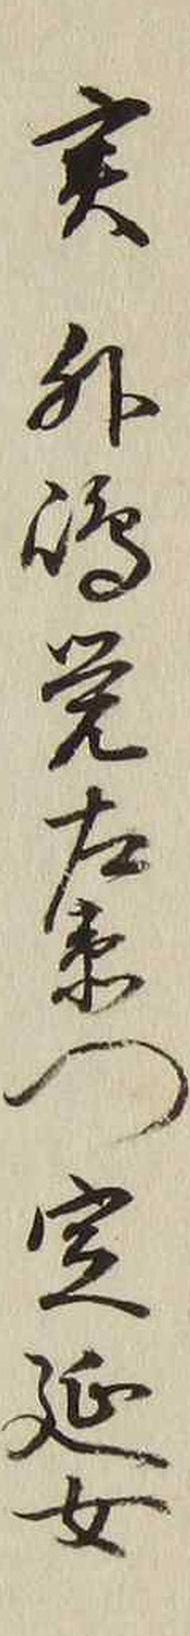実外嶋覚左衛門定延女

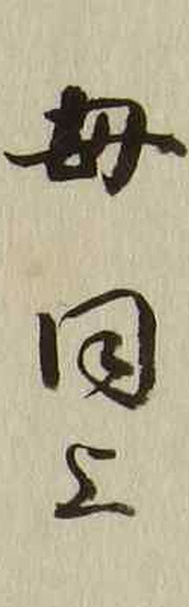母同上
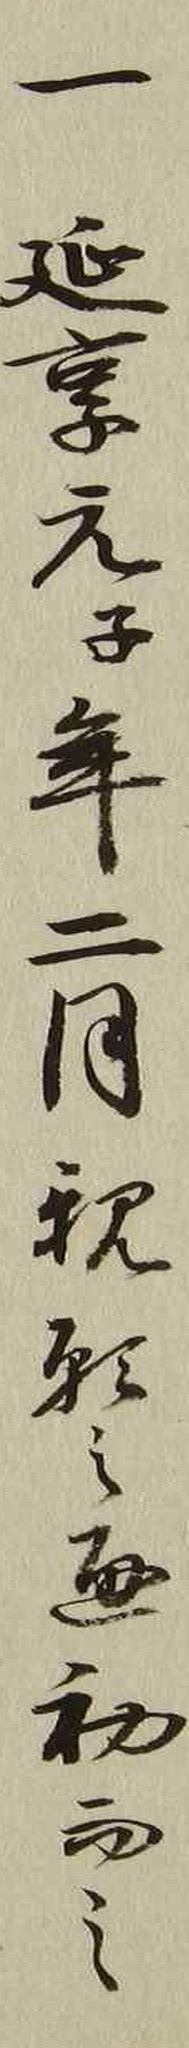一延享元子年二月親願之通初而之
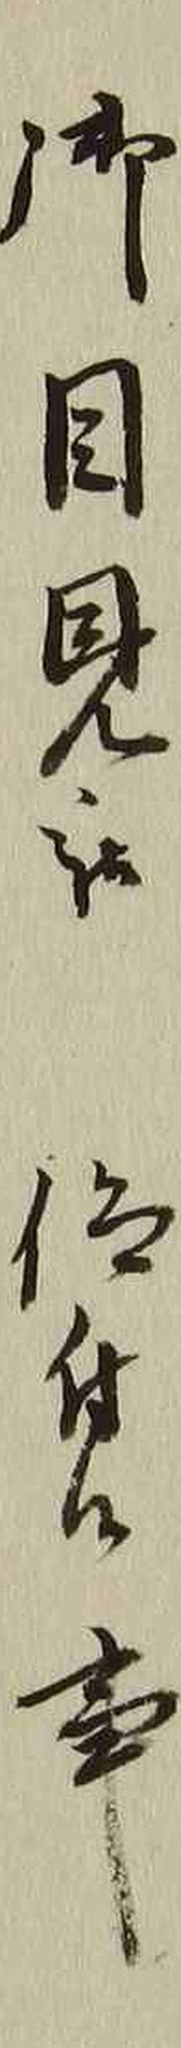御目見被仰付候事
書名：諸士系譜　巻之61　と之部4
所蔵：会津若松市立会津図書館
